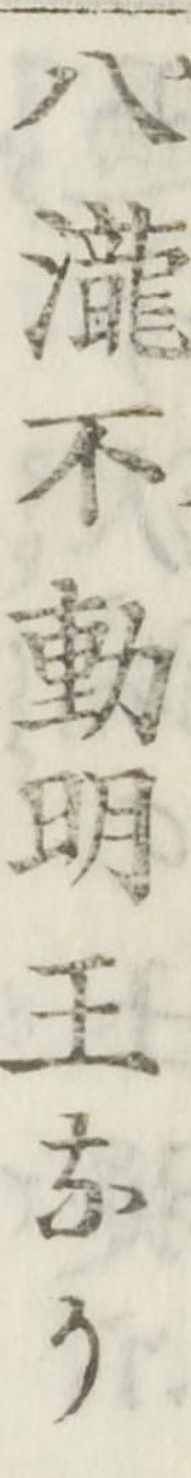八滝不動明王なり
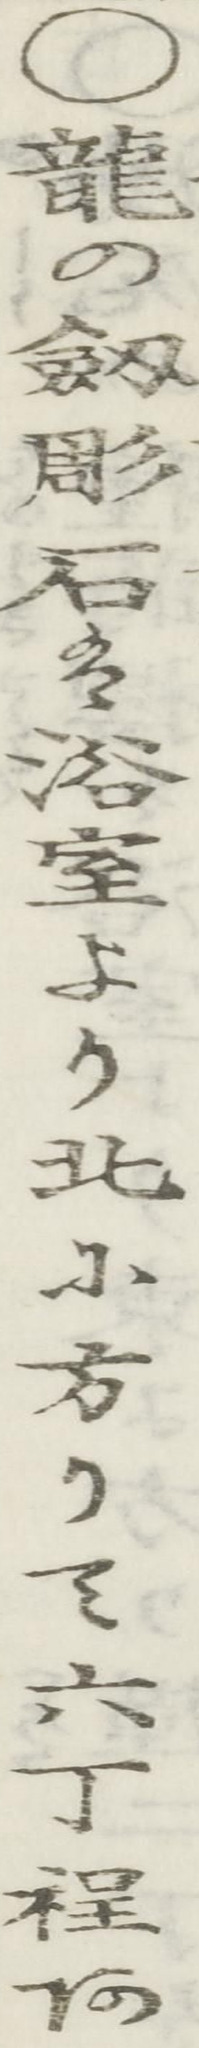〇龍の剣彫石は浴室より北に方りて六丁程あ
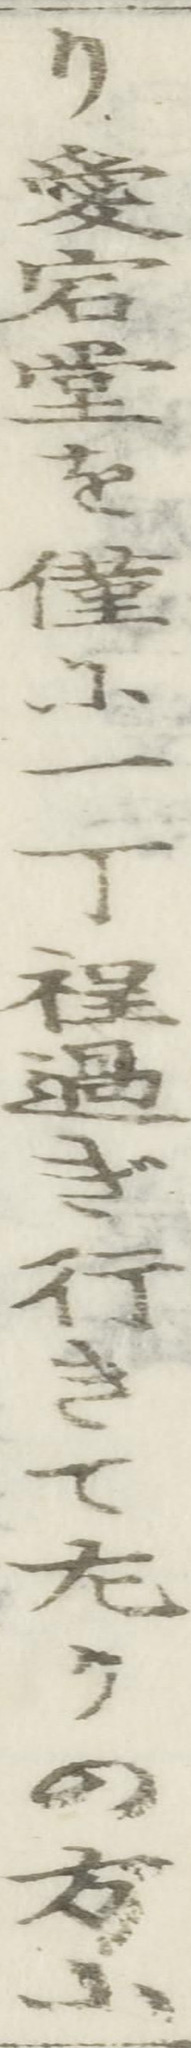り愛宕堂を僅に一丁程過ぎ行きて左りの方に
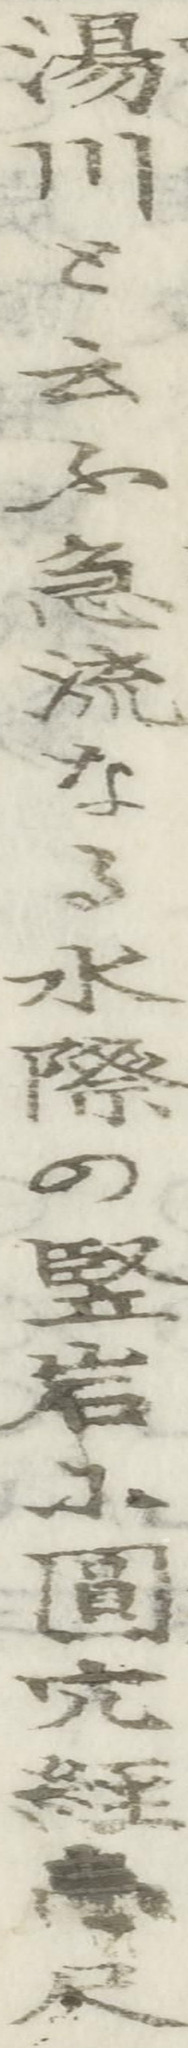湯川と云ふ急流なる水際の竪岩に円穴経壹尺
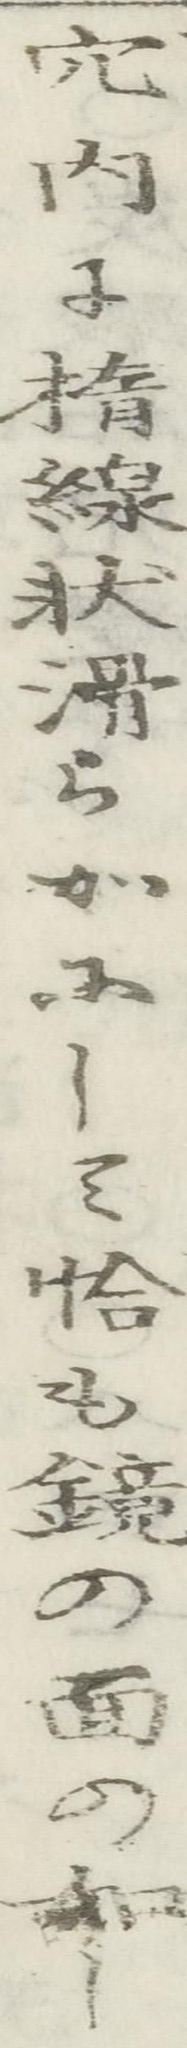穴内に楕線状滑らかして恰も鏡の面の如し
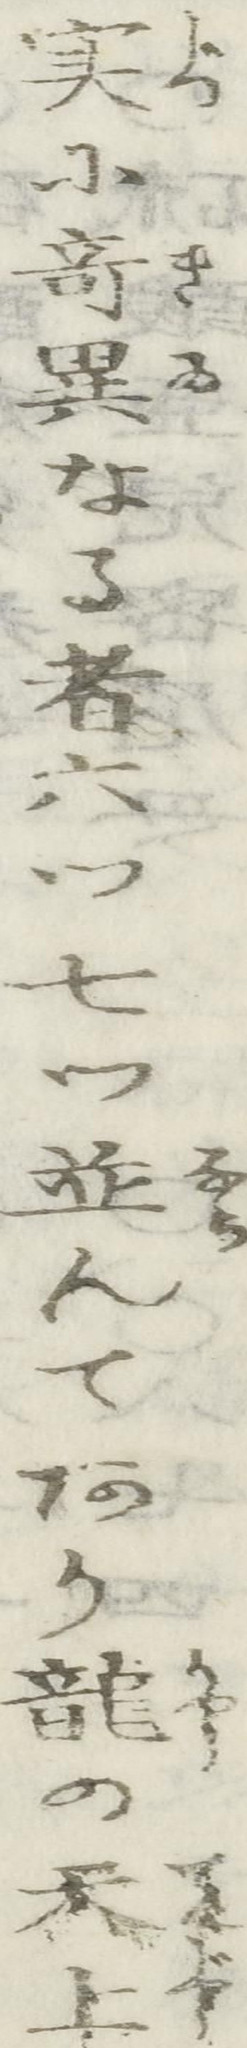実に奇異なる者六つ七つ並んてあり龍の天上
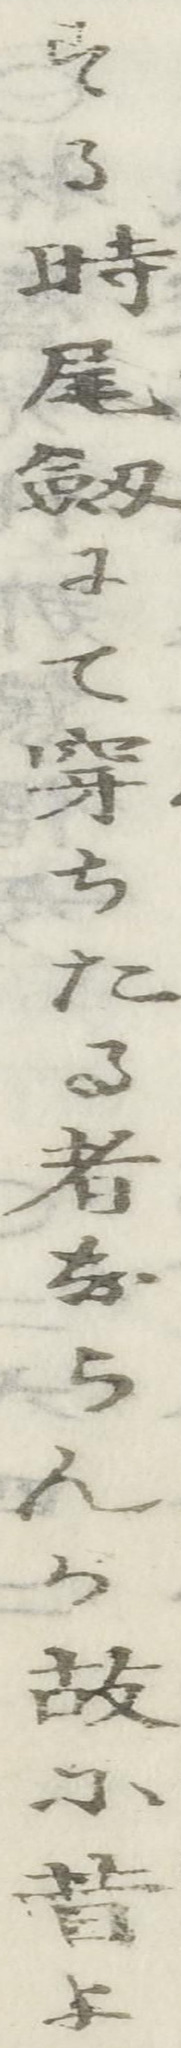する時尾剣にて穿ちたる者ならんか故に昔よ
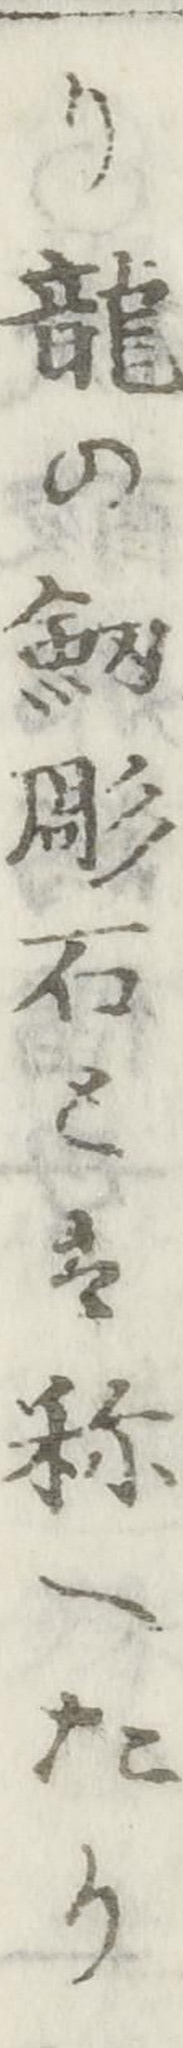り龍の剣彫石とは称へたり
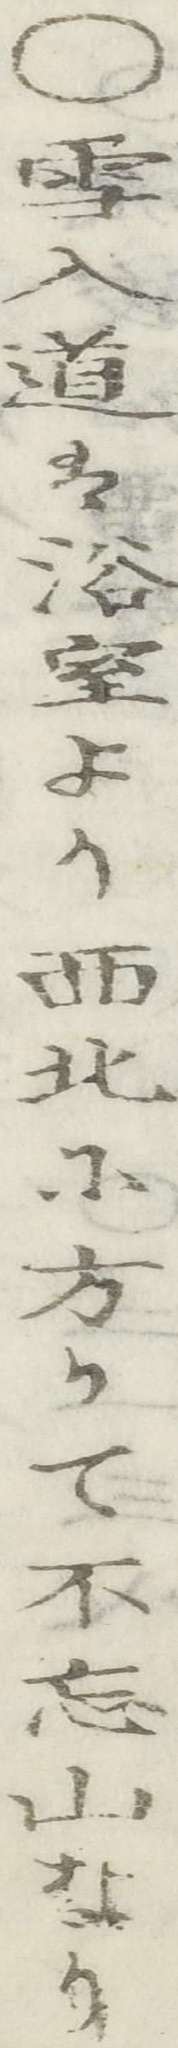〇雪入道を浴室より西北に方りて不忘山なり
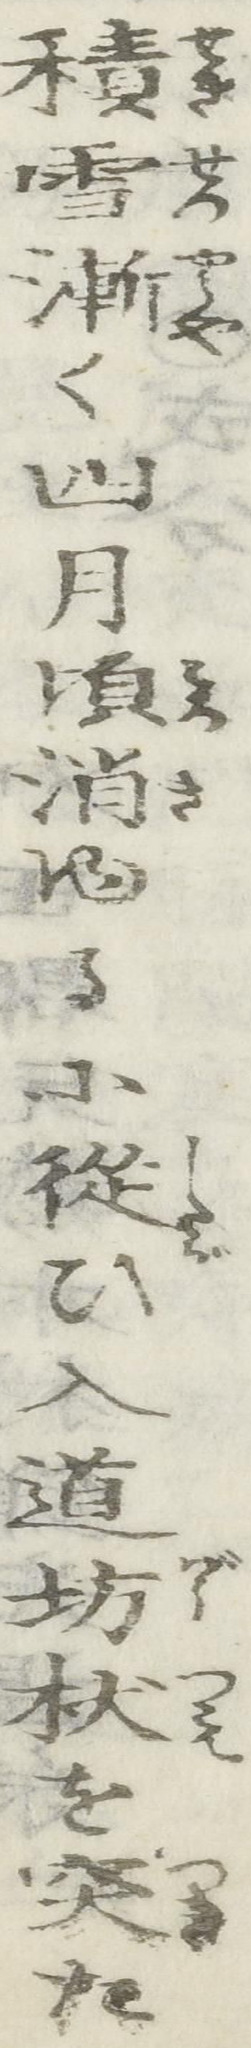積雪漸く四月頃消ゆるに従ひ入道坊杖を突た
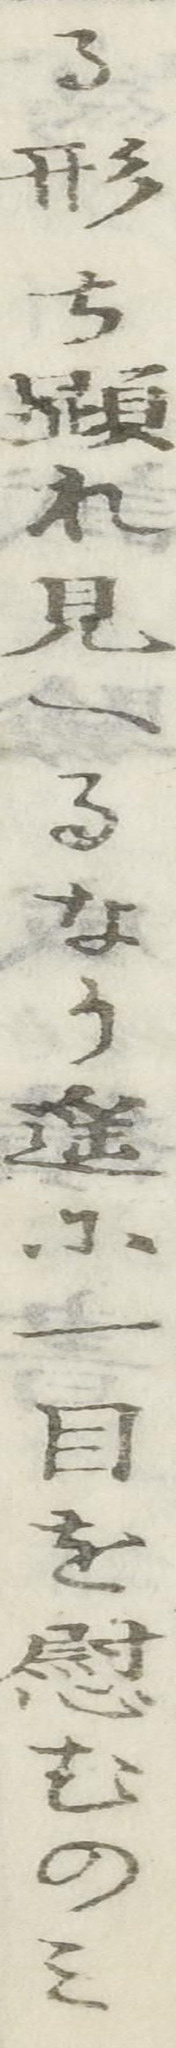る形ち顕れ見へるなり遥に一目を慰むのみ

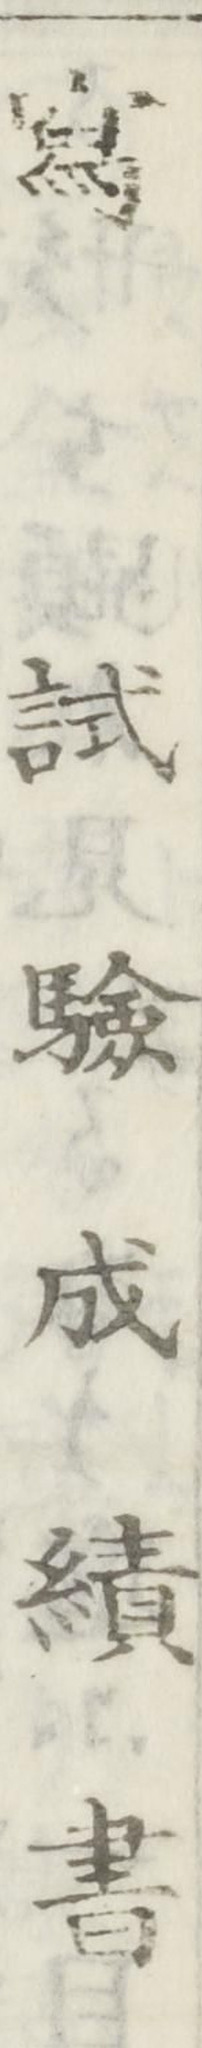写試験成績書
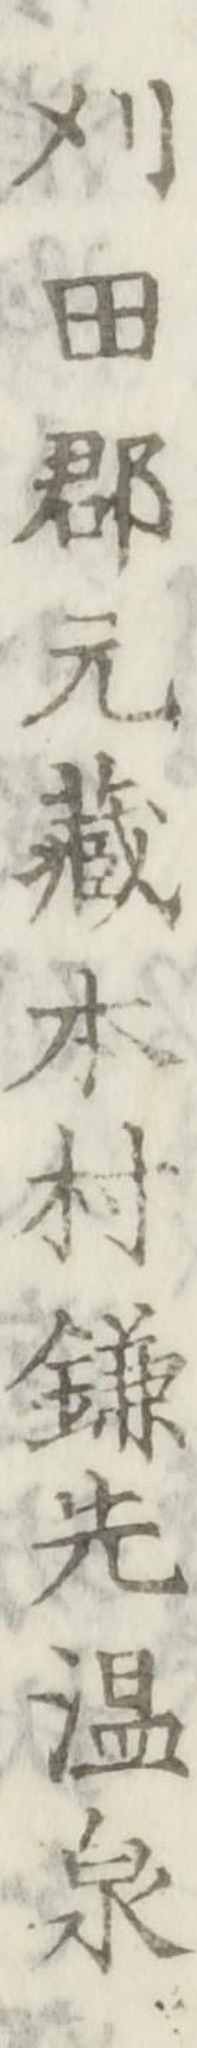刈田郡元蔵本村鎌先温泉
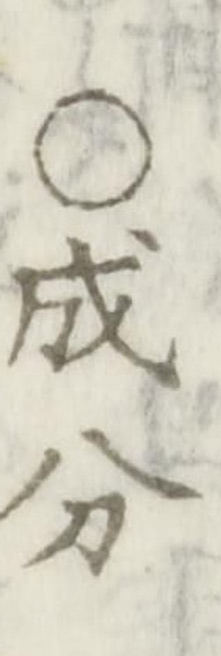〇成分
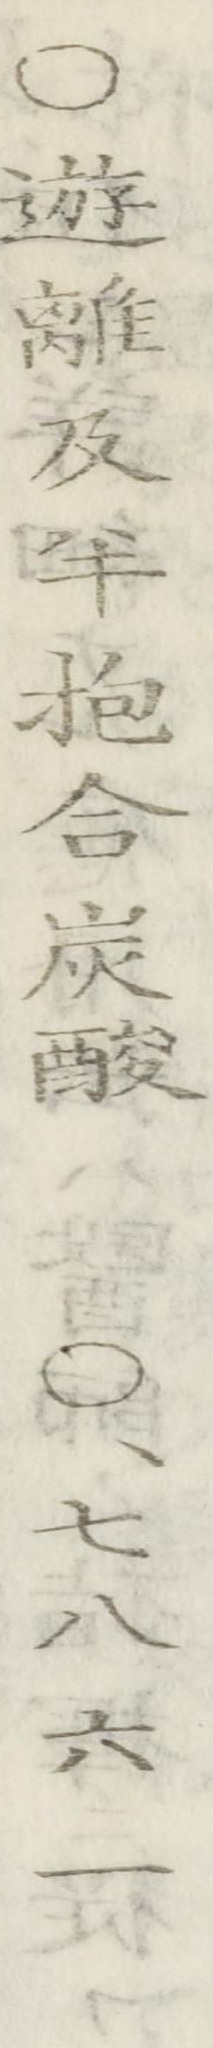〇遊離及半抱合炭酸〇、七八六一
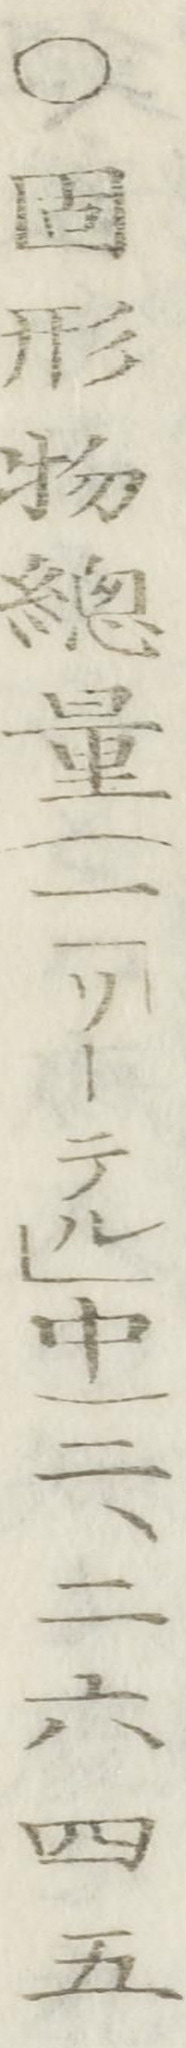〇固形物総量一「リーテル」中二、二六四五
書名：鎌先温泉由來記
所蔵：東京大学地震研究所図書室 Earthquake Research Institute Library, The University of Tokyo, JAPAN
